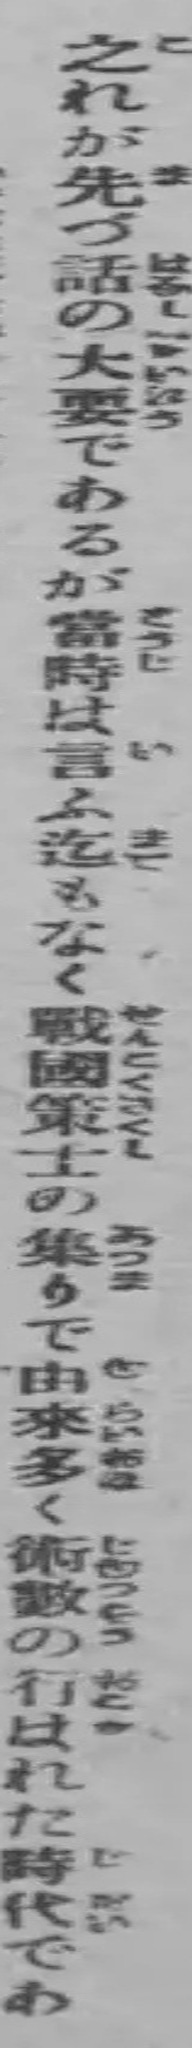之れが先づ話の大要であるが当時は言ふ迄もなく戦国策士の集りで由来多く術数の行はれた時代であ
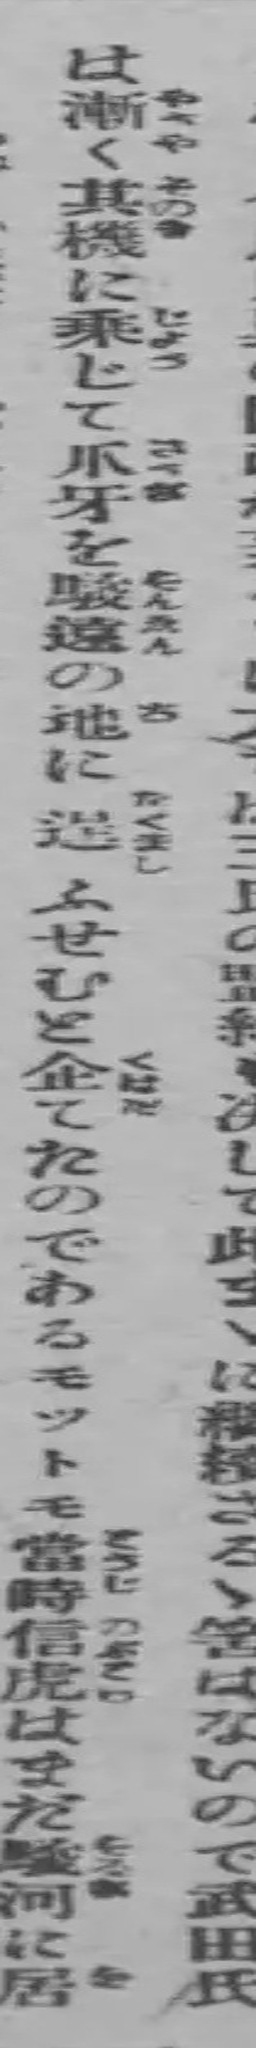は漸く其機に乗じて爪牙を駿遠の地に逞ふせむと企てたのであるモツトモ当時信虎はまだ駿河に居
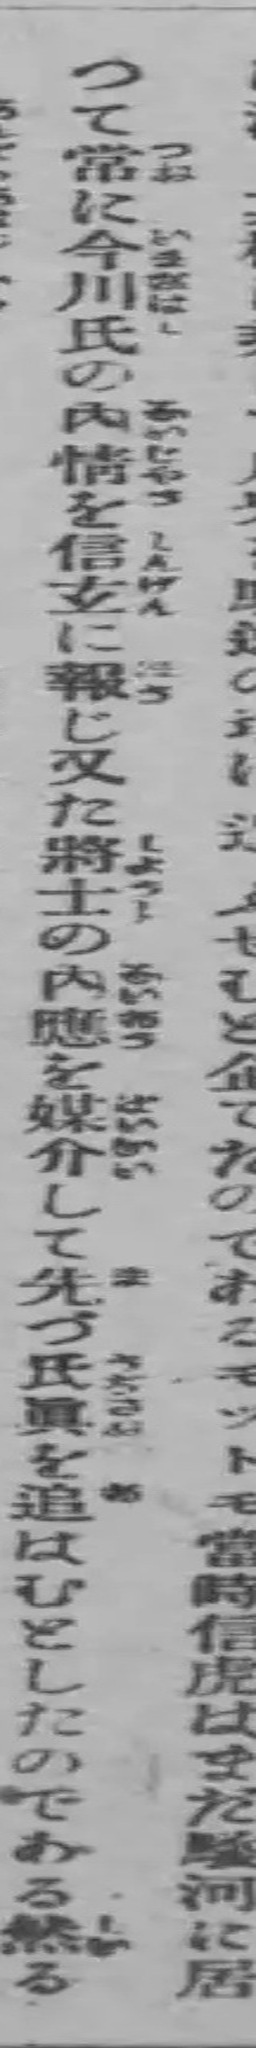つて常に今川氏の内情を信玄に報じ又た将士の内応を媒介して先づ氏真を追はむとしたのである然る
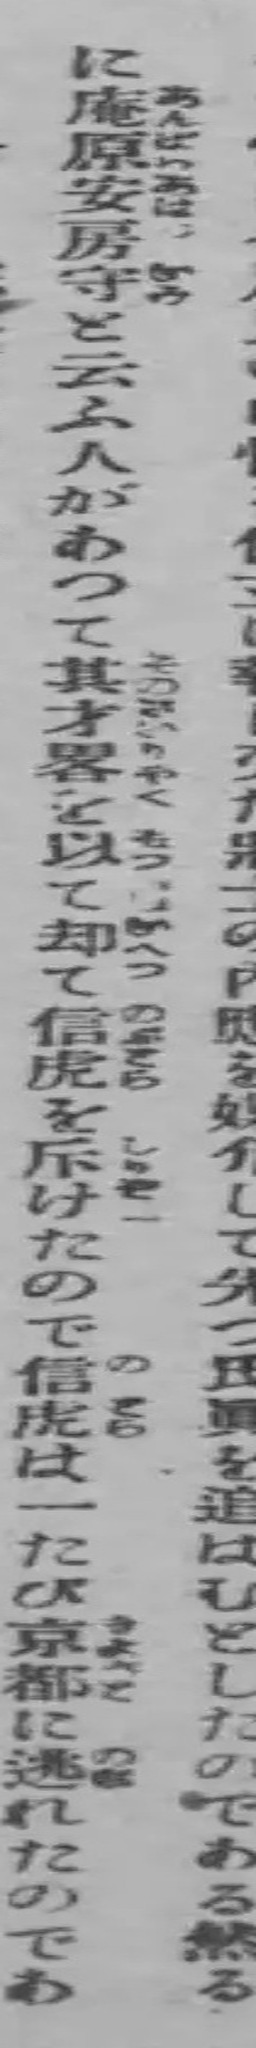に庵原安房守と云ふ人があつて其才略を以て却て信虎を斥けたので信虎は一たび京都に逃れたのであ
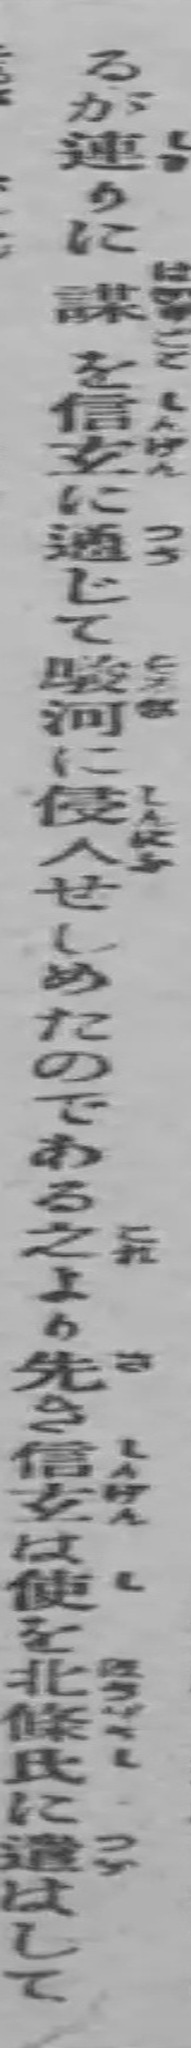るが連りに謀を信玄に通じて駿河に侵入せしめたのである之より先き信玄は使を北条氏に遣はして
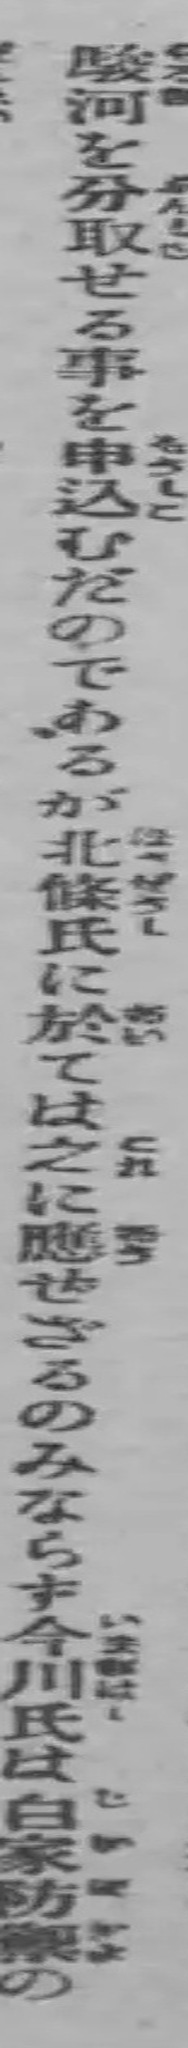駿河を分取せる事を申込むだのであるが北条氏に於ては之に応ぜざるのみならず今川氏は自家防禦の
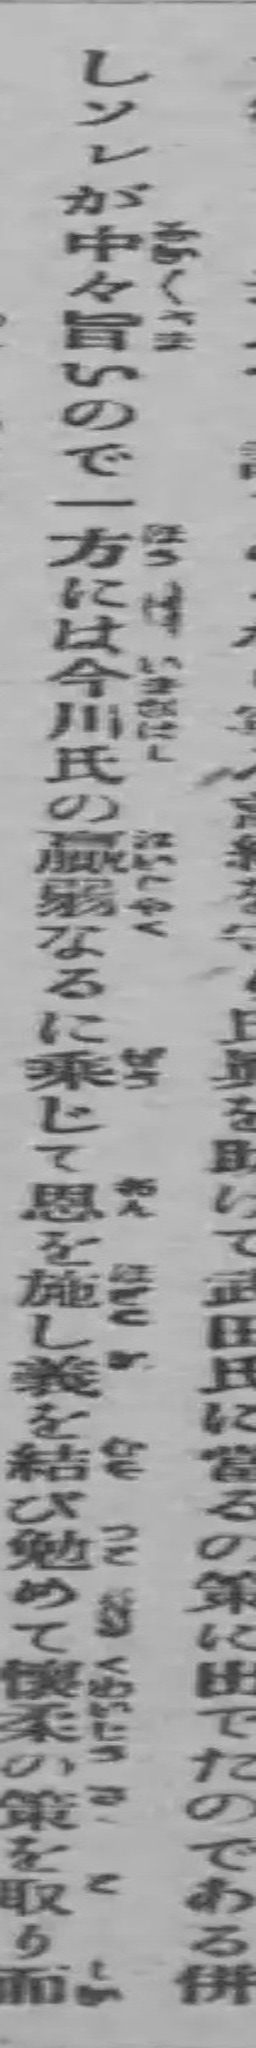しソレが中々旨いので一方には今川氏の嬴弱なるに乗じて恩を施し義を結び勉めて懐柔の策を取り而
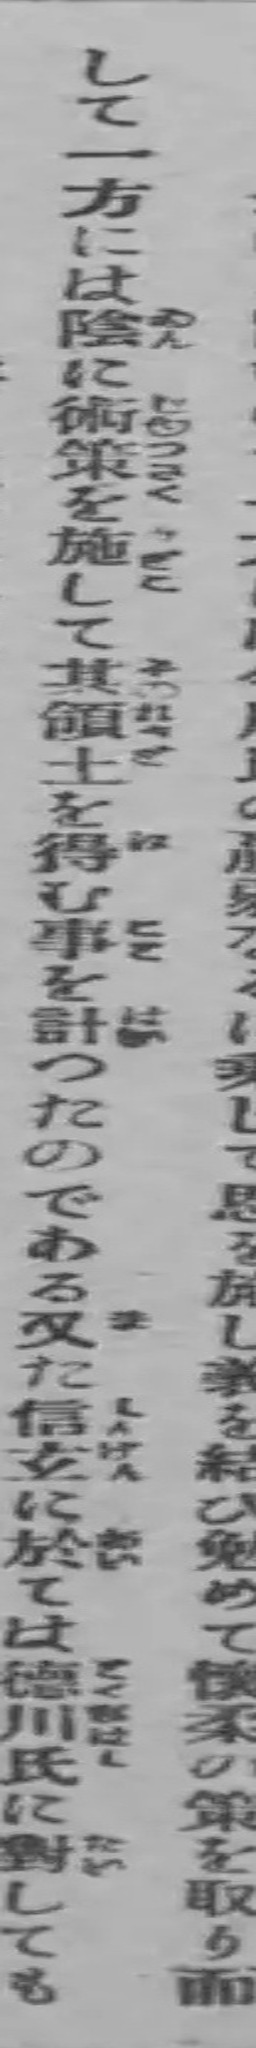して一方には陰に術策を施して其領土を得む事を計つたのである又た信玄に於ては徳川氏に対しても
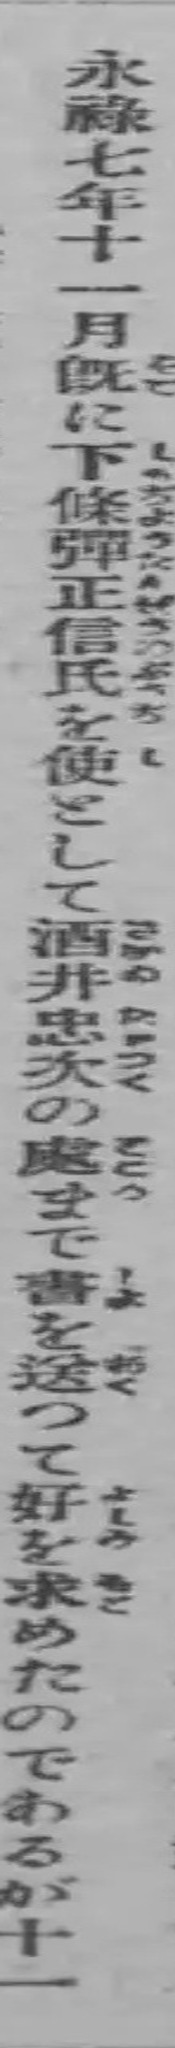永禄七年十一月既に下條弾正信氏を使として酒井忠次の処まで書を送つて好を求めたのであるが十一
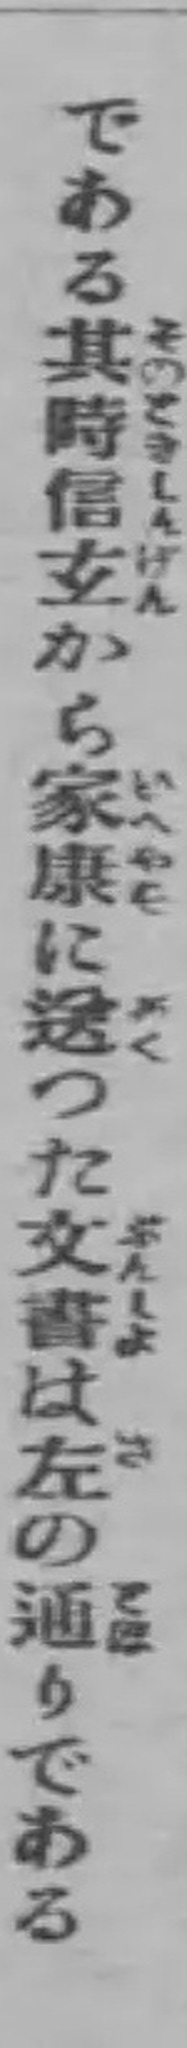である其時信玄から家康に送つた文書は左の通りである
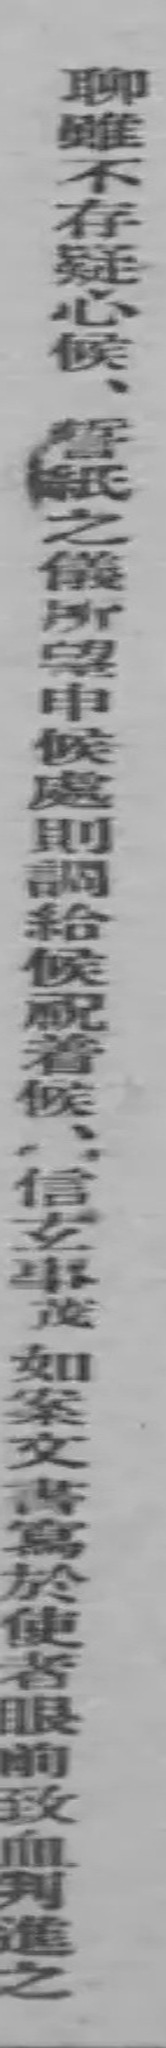聊雖不存疑心候、誓紙之儀所望申候処則調給候祝着候、信玄事茂如案文書写於使者眼前致血判進之
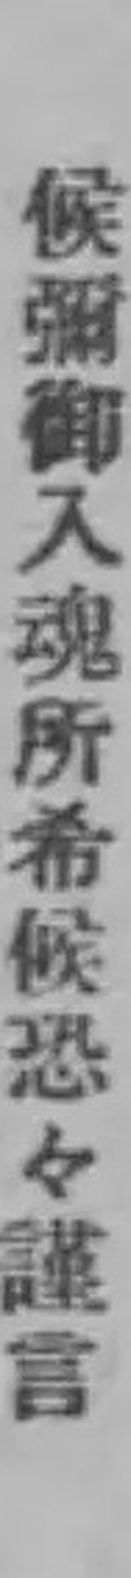候弥御入魂所希候恐々謹言
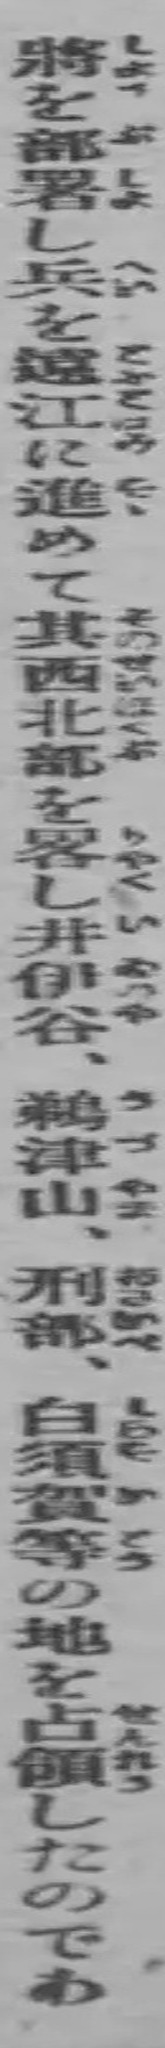将を部署し兵を遠江に進めて其西北部を略し井伊谷、鵜津山、刑部、白須賀等の地を占領したのであ
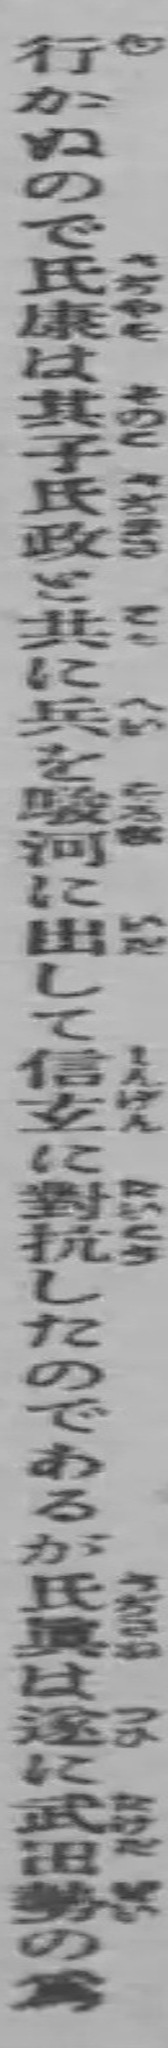行かぬので氏康は其子氏政と共に兵を駿河に出して信玄に対抗したのであるが氏真は遂に武田勢の為
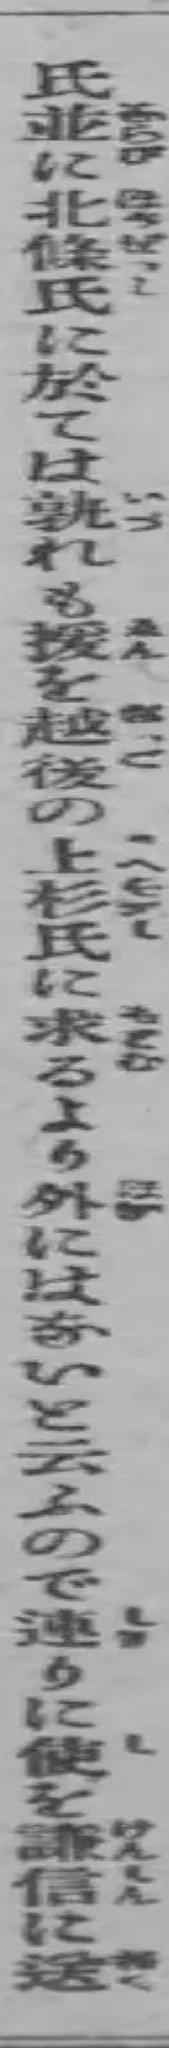に求む氏並に北条氏に於ては孰れも援を越後の上杉氏に求るより外にはないと云ふので連りに使を謙信に送
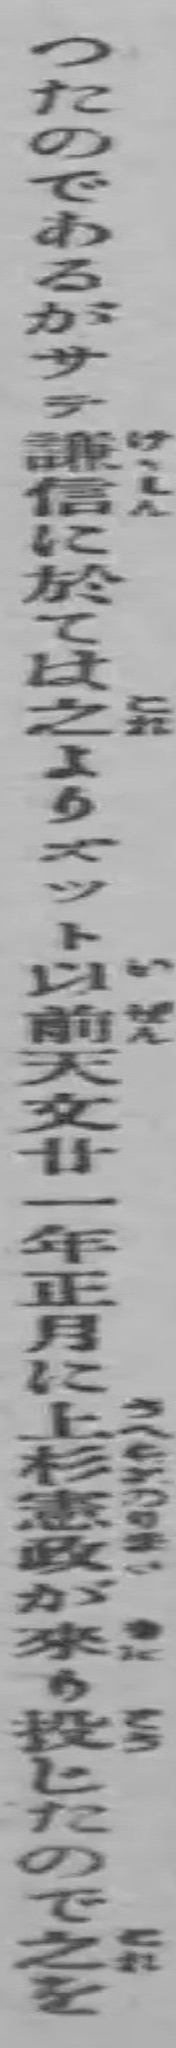つたのであるがサテ謙信に於ては之よりズツト以前天文廿一年正月に上杉憲政が来り投じたので之を
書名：豊橋市史談
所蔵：国立国会図書館 National Diet Library, JAPAN
